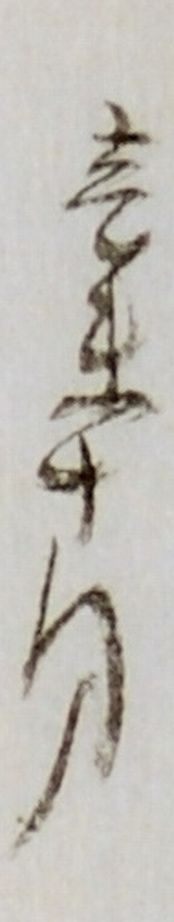辛未十月
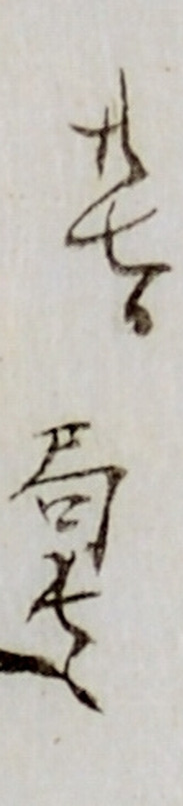廿七日
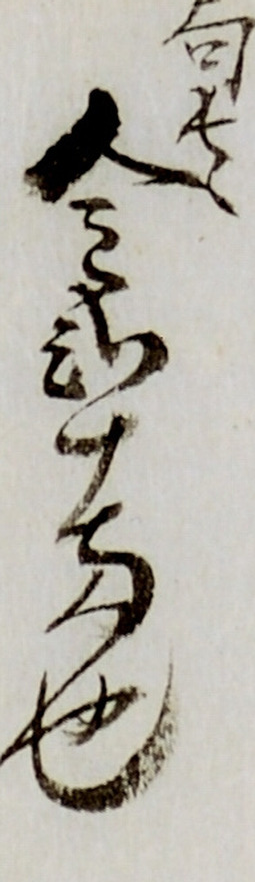金弐十両也
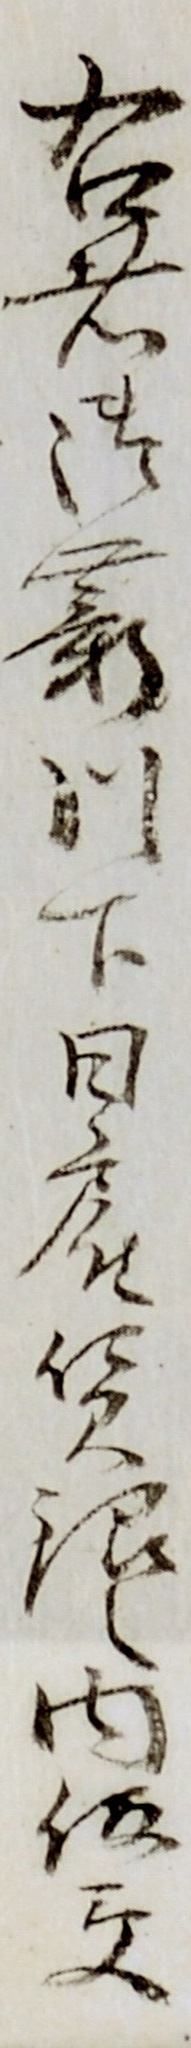右は御薪川下日雇賃銀之内仮受
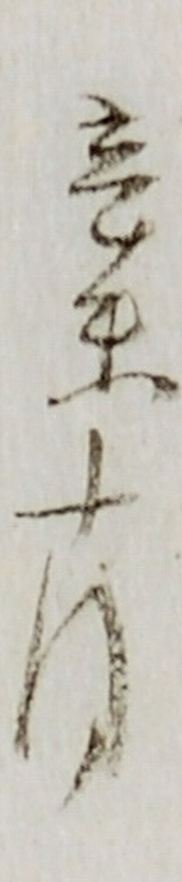辛未十月
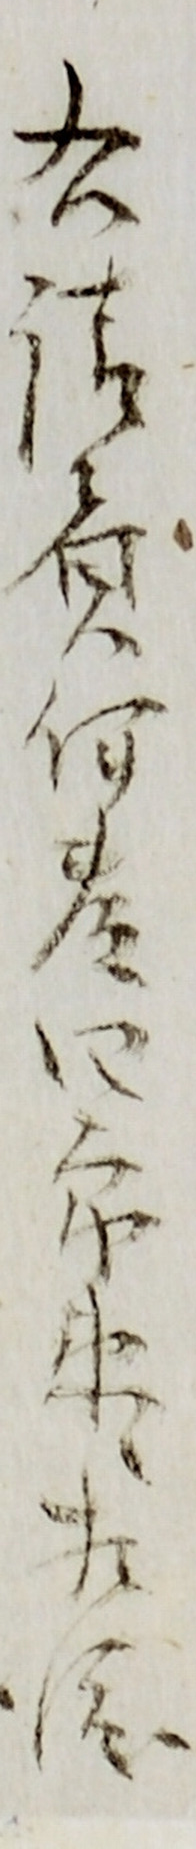右請負伊藤四郎衛へ相渡
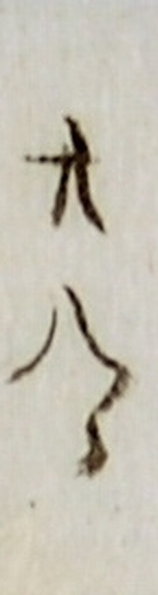廿八日
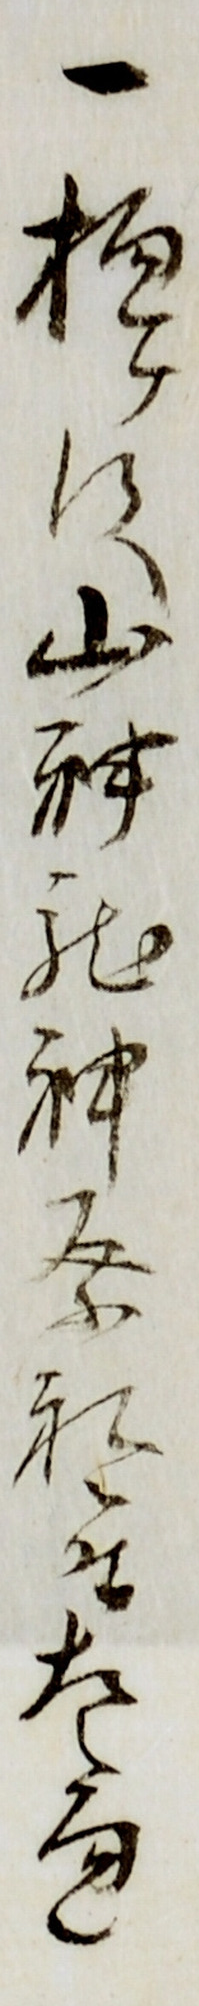一樋ヶ沢山神龍神祭礼に付左之通
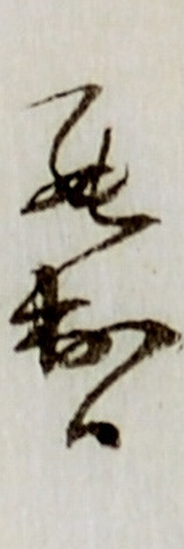罷出候
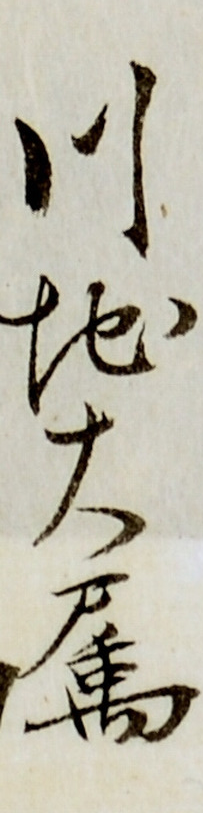川地大属
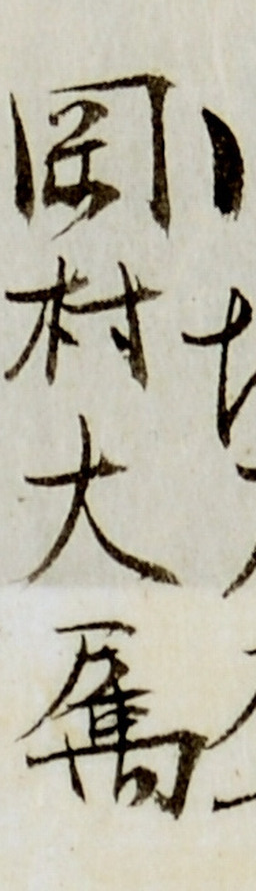岡村大属
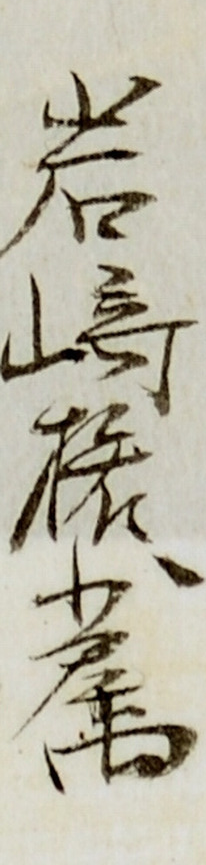岩崎権少属
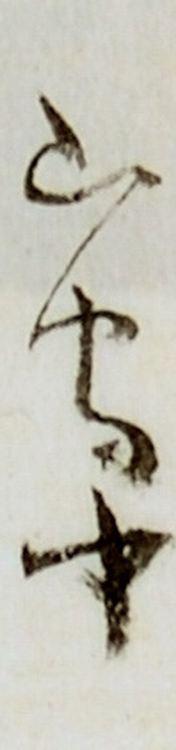山守中
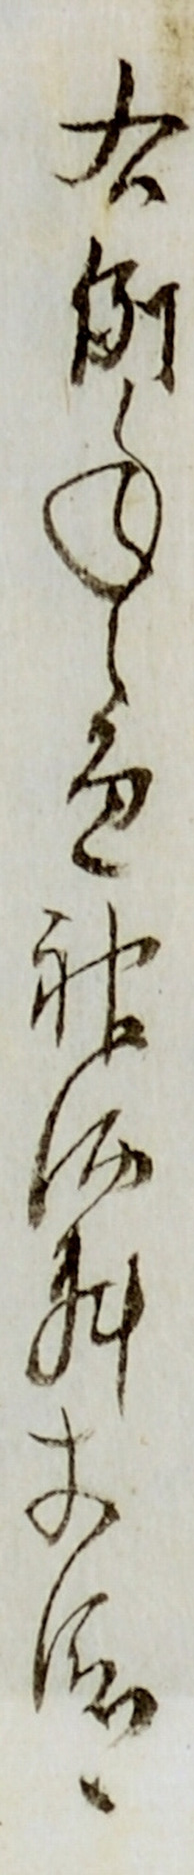右例年之通神酒料相渡

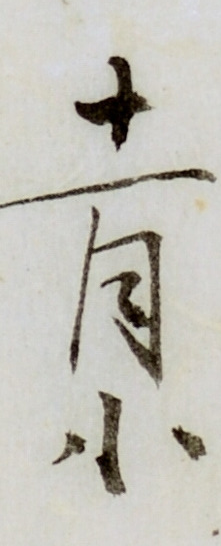十一月小
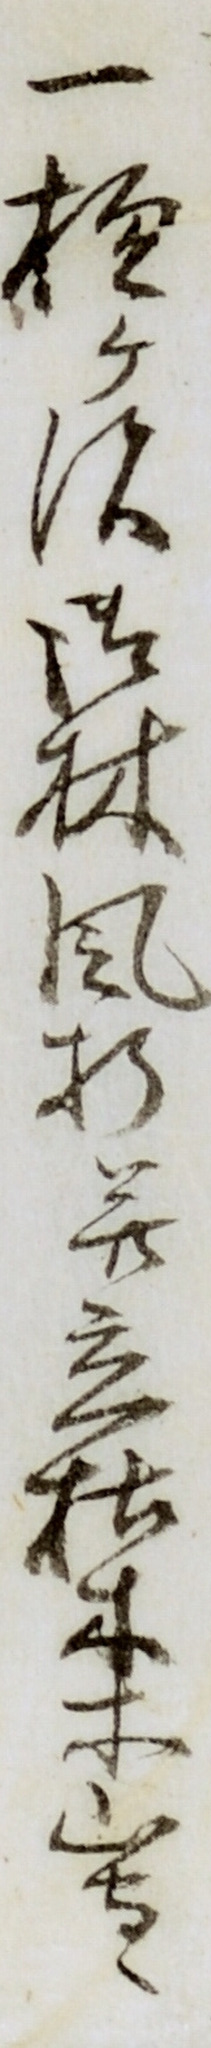一樋ヶ沢御林風折幷立枯木等山守へ
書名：山林方諸事御用留
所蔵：伊那市立高遠町図書館・合同会社AMANE
